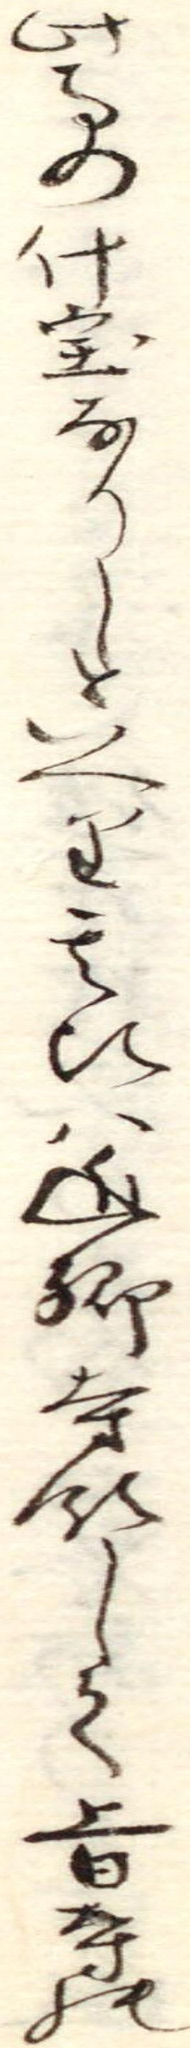此寺の什宝なりしといへり其頃は近郷の寺領して旨寺の
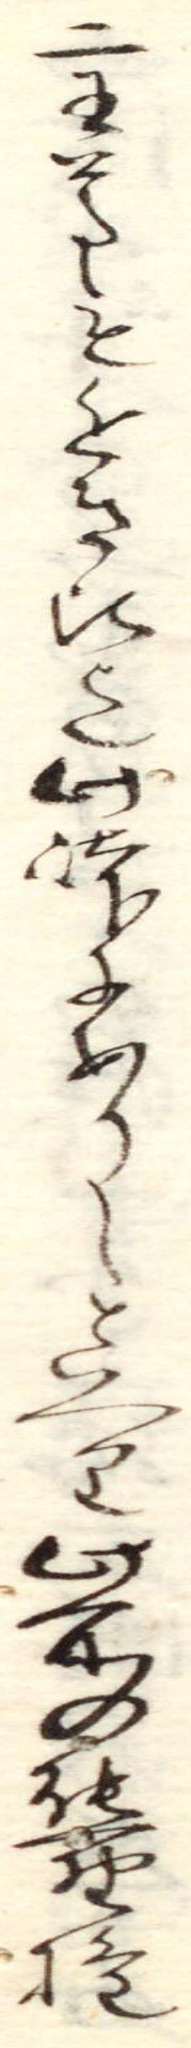二王尊も近き頃迄此峠にありしといへり此所の熊野権
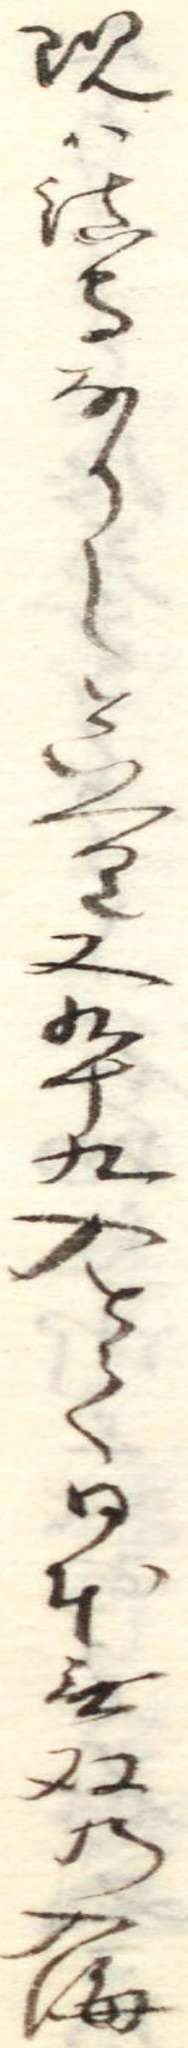現は鎮守なりしといへり又九十九入とて日本無双の入海
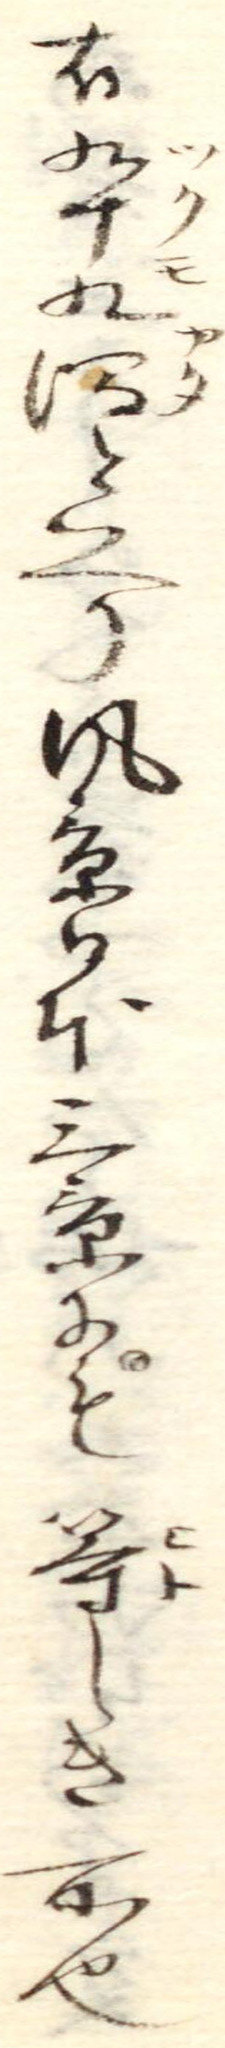有九十九潟といへり風景日本三景にも等しき所也
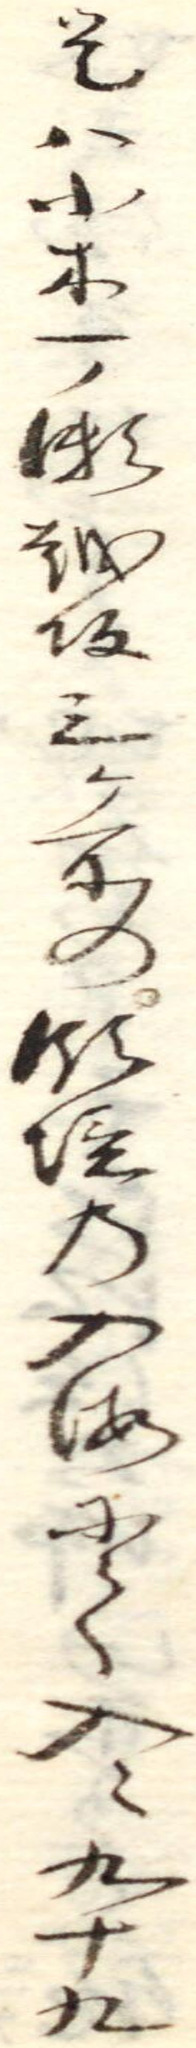是は小木一ノ瀬越坂三ヶ所の領境の入海にて入々九十九
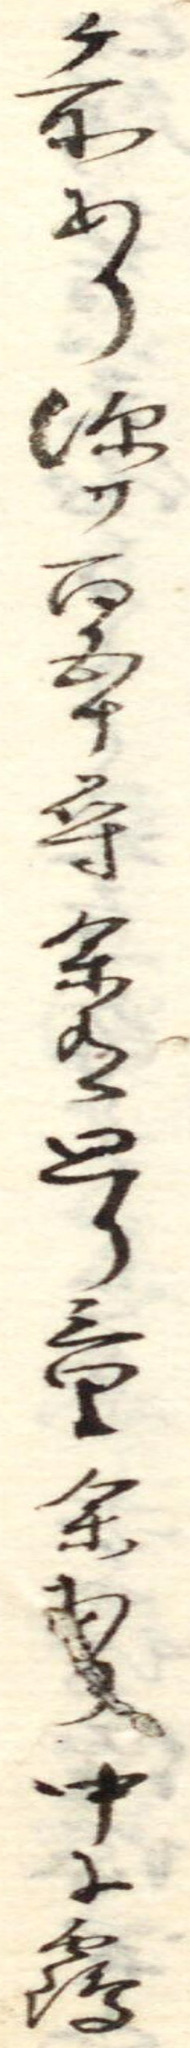ヶ所あり深さ百五十尋余有廻り三里余あり中に鶴
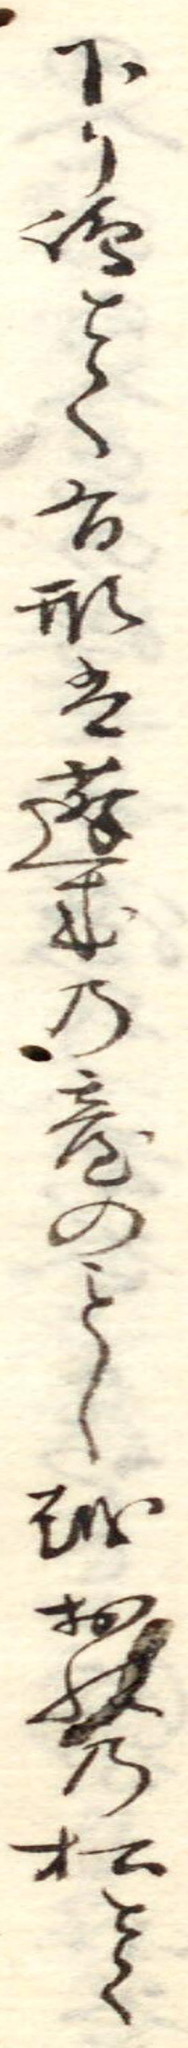下り嶋とて有形は蓬莱の台のことし越おれの松とて
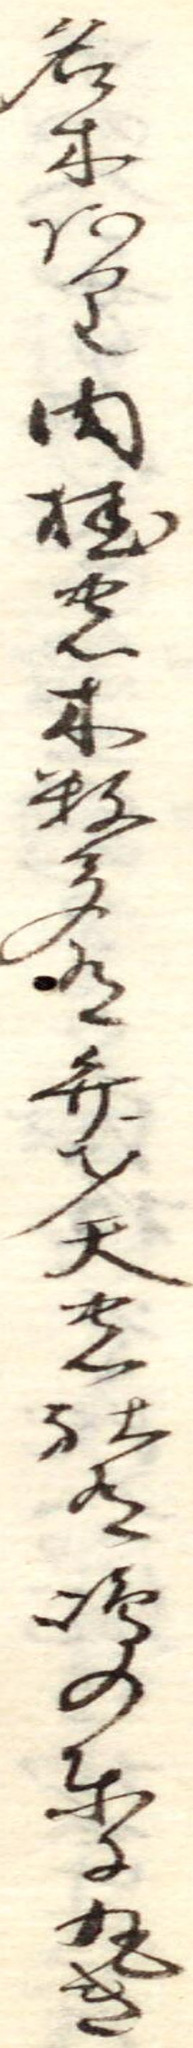名木あり肉桂の木数多有弁才天の社有嶋の東に丸き
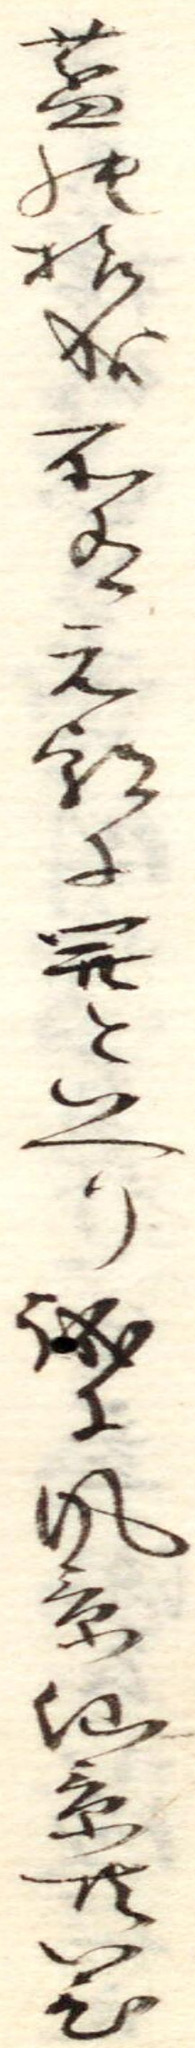蓋の様成所有元朝に開といへり誠に風景仙景共いひ
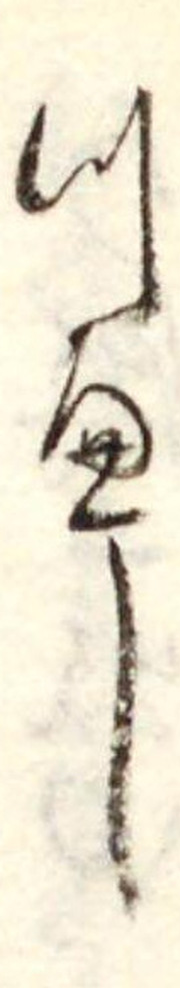つへし
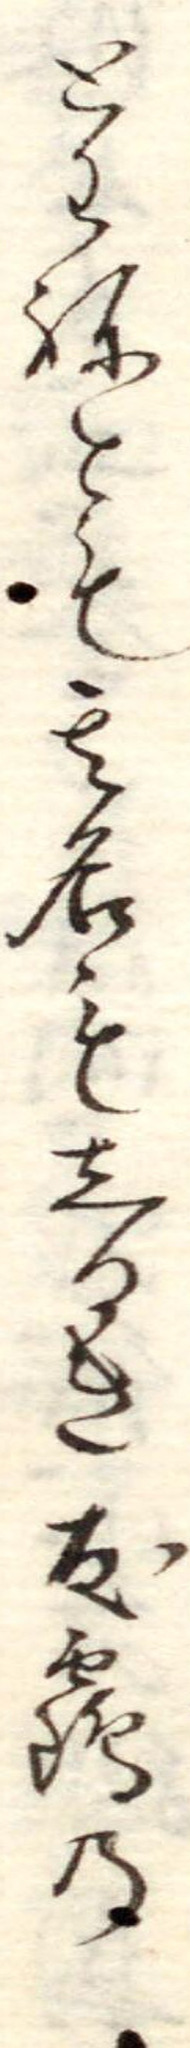とわねとも其名もしるき度鶴の
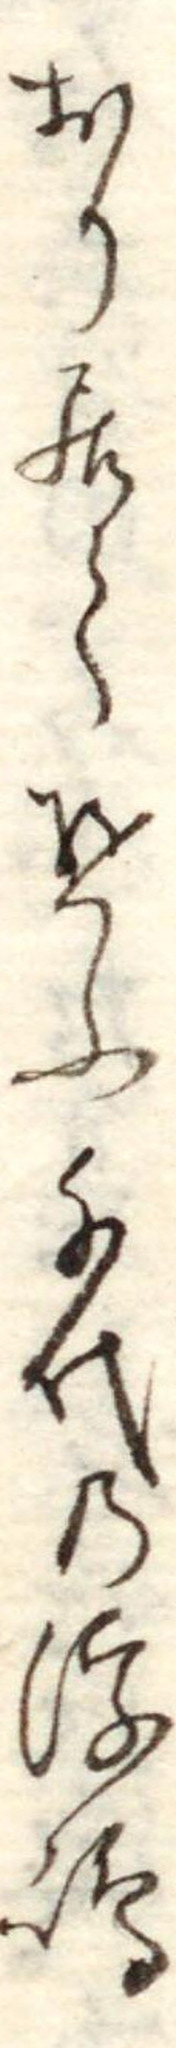おり居てねかふ千代の浮嶋
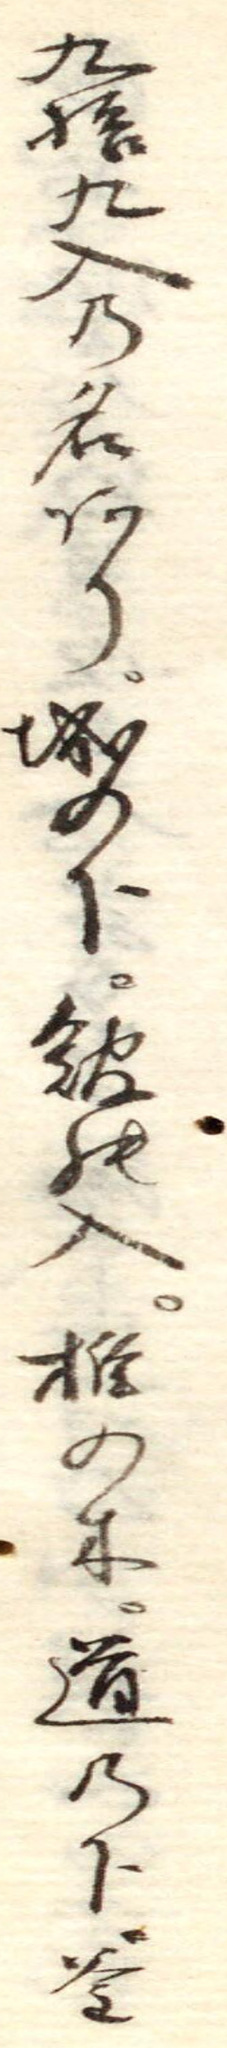九拾九入の名あり。城の下。館の入。椎の木。道の下。釜
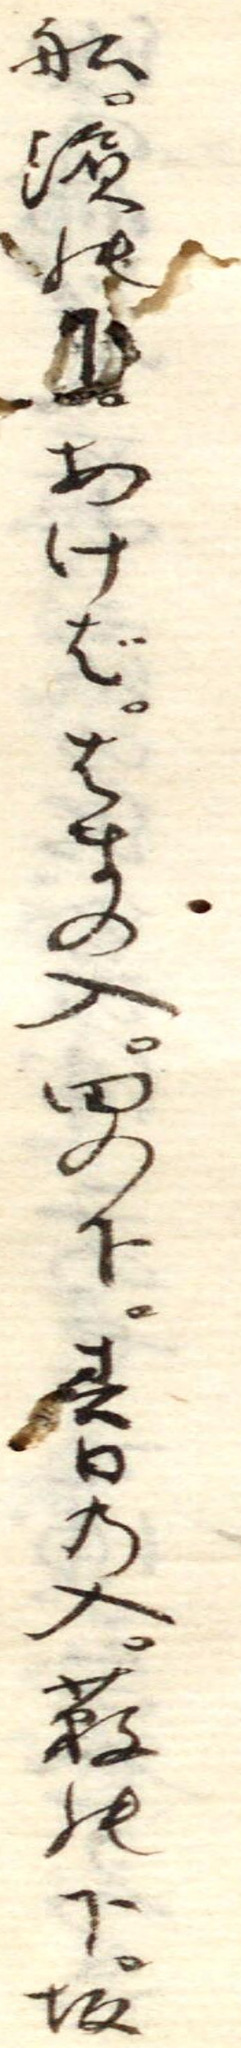船。浜の下。あけば。はまの入。田の下。春日の入。薮の下。坂
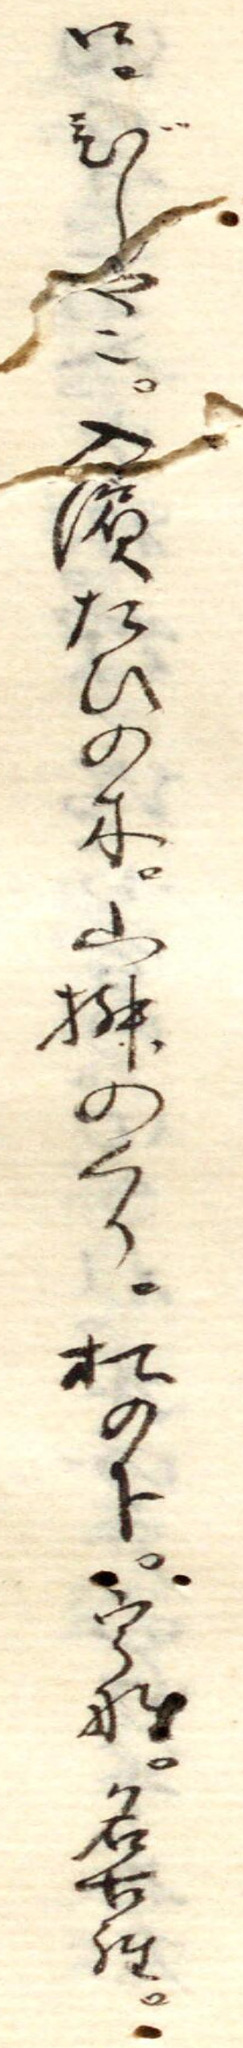口。ひしやこ。入浜たひの木。山枡のくり。松の下。宇那。名古性。

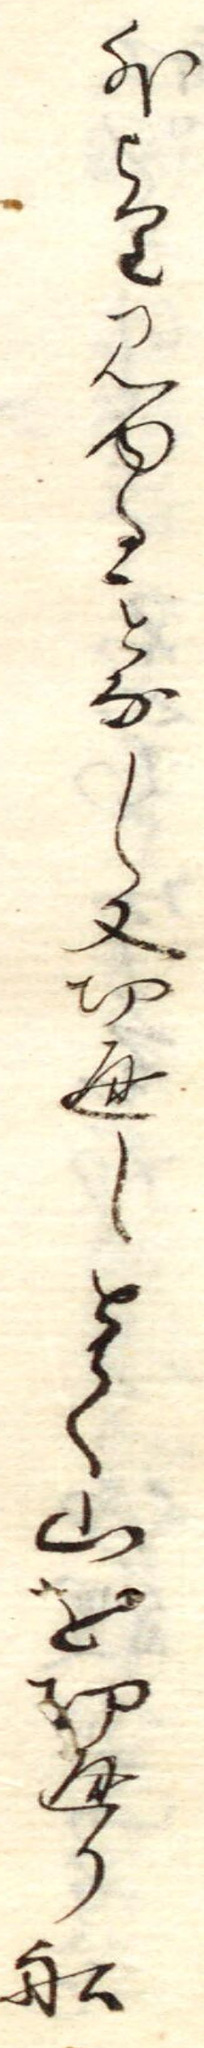外より見ゆることなし又切通しとて山を切通り船
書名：能登名跡誌
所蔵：Ishikawa Prefectural Library
